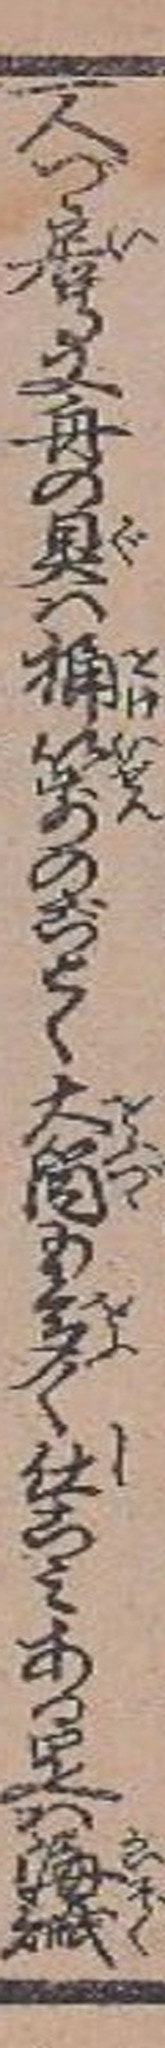一人づゝ居る又舟の具は桶箭のごとく大筒も多く仕こみある是は海賊
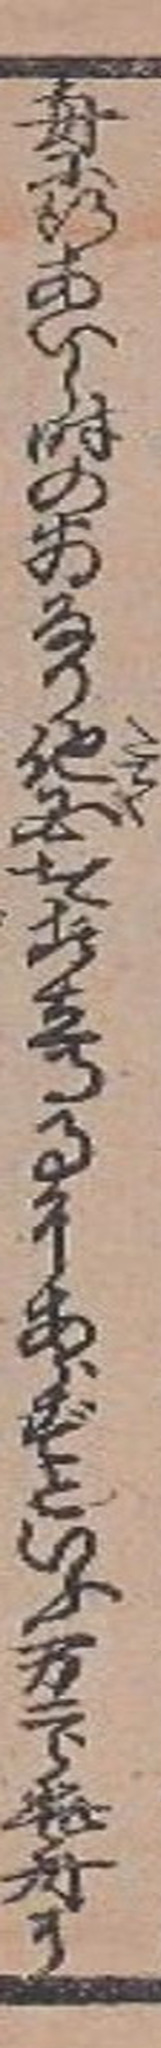舟に行あいし時のなり他国を打立る事にあらずといふ万二郎此舟に
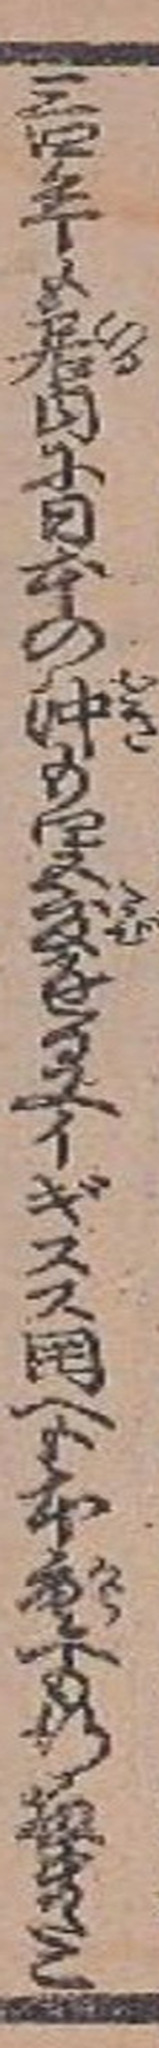三四年も居内に日本の沖も四五度通る又イギスス国へも本唐へも行扨またこ
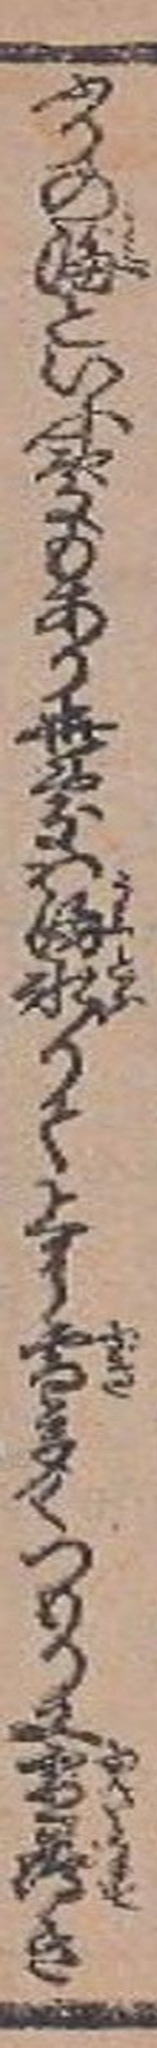ふりの海といふ処もあり此処は海氷りて上に雪多くつもり又雪薄き
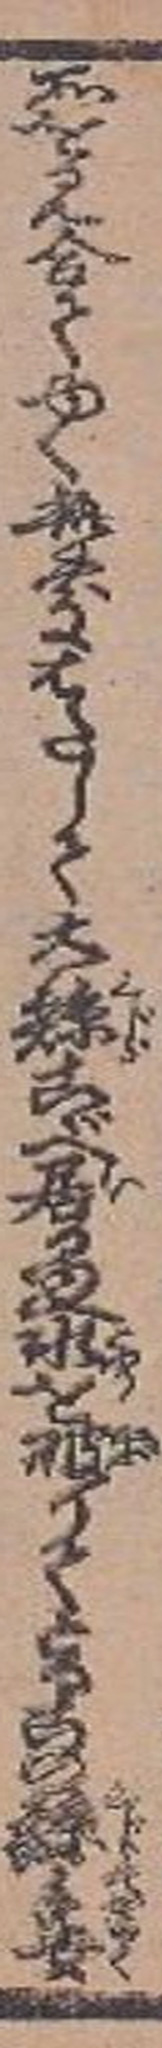所を見合てゆく此所はたして大鯨こゞへ居るゆへ氷を破りてとるこの鯨手安
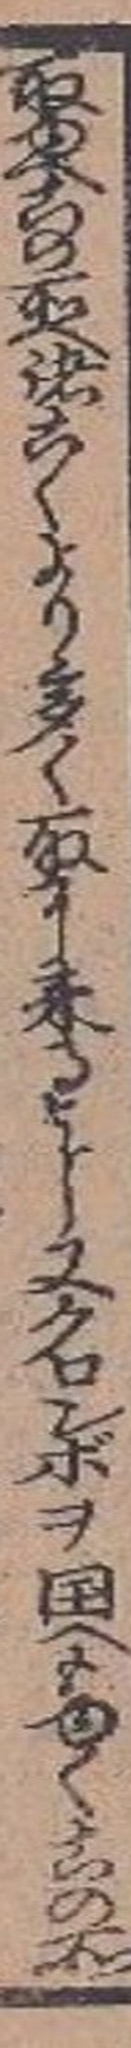取ゆへこの所へ諸こくより多く取に来るよし又クロンボヲ国へもゆくこの所
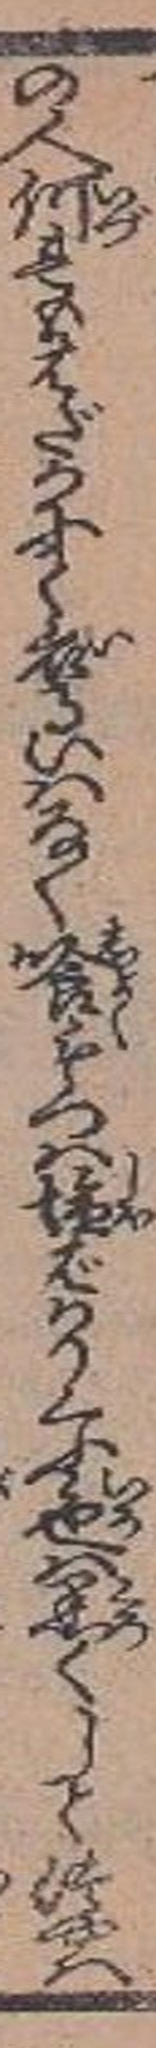の人何れもはだかにて衣るいはなく喰もつは塩ばかりくふ色は黒くしてつやは
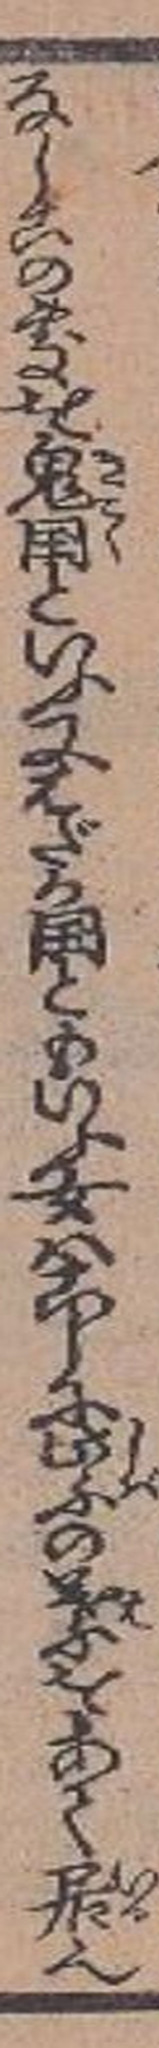なしこの所を鬼国といふ又はだか国ともいふ女はこしに柴の葉をあて居也
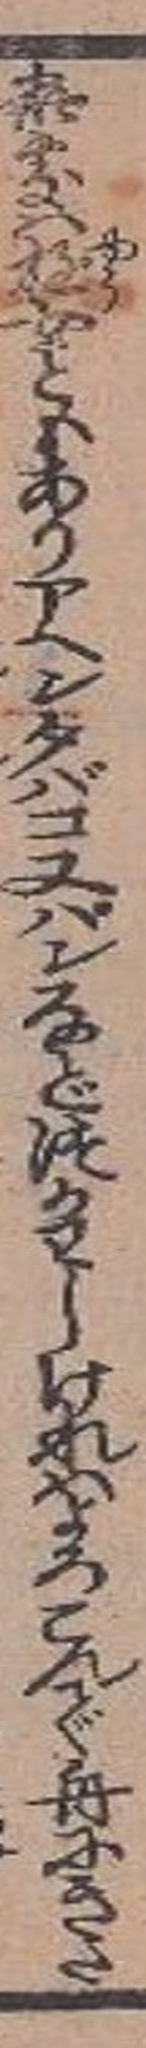此処は遊女ともありアヘンタバコ又パンなどつかわしけれはよろこんで舟にきた
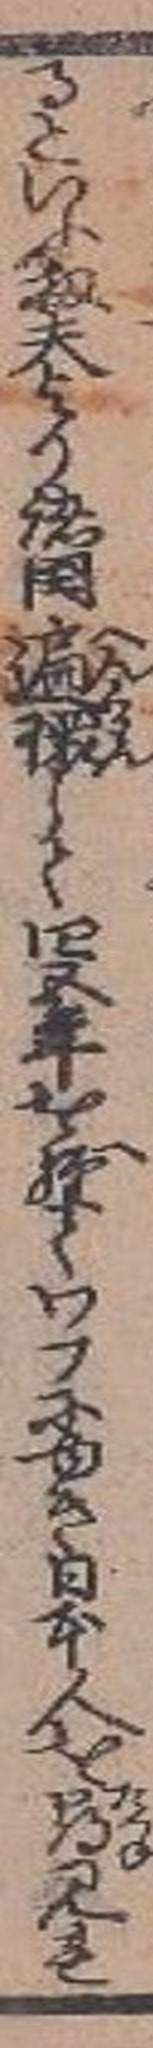るといふ扨夫より諸国遍環して四五年を経てワフにゆき日本人を尋見れ
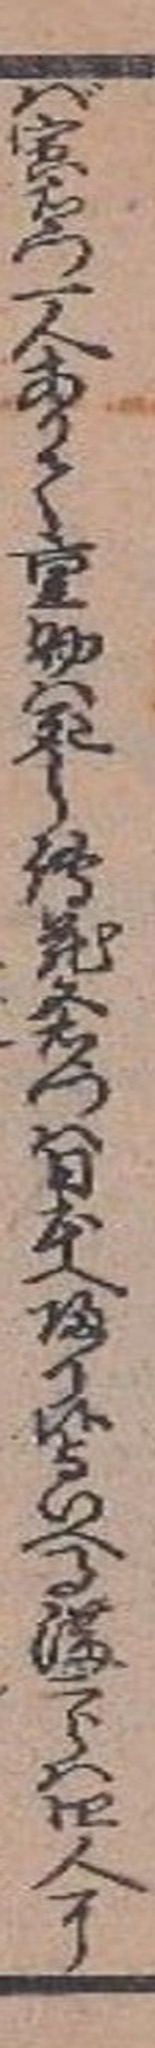ば寅右衛門一人ありて重助は死し伝蔵五右衛門は日本へ帰り候といへる満二郎は四人に
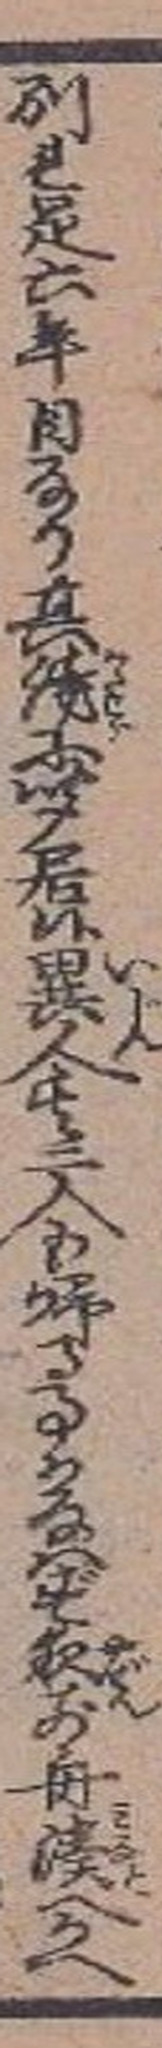別れ是六年目なり其傍に聞居候異人其二人も帰る事かなはず夜前舟湊へかへ
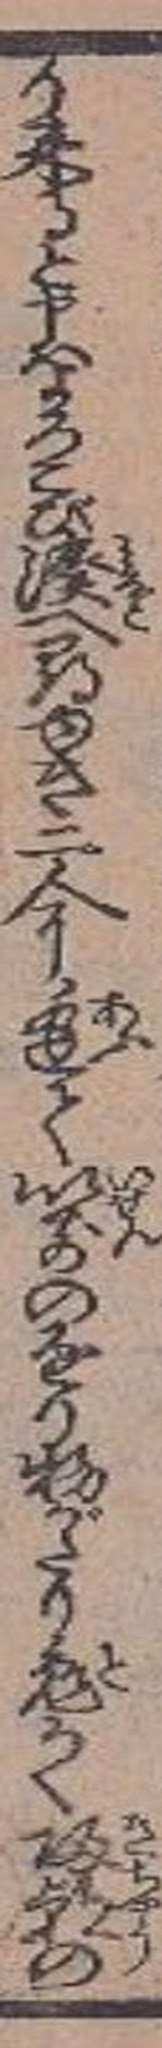り来ると申はよろこび湊へ尋ゆき二人に会て以前の通り物がたり兎かく帰朝の
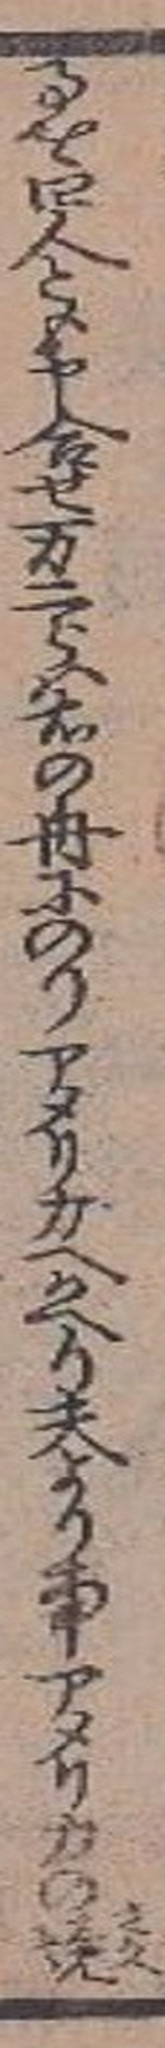事を四人とも申合せ万二郎は右の舟にのりアメリカへかへり夫より南アメリカの境
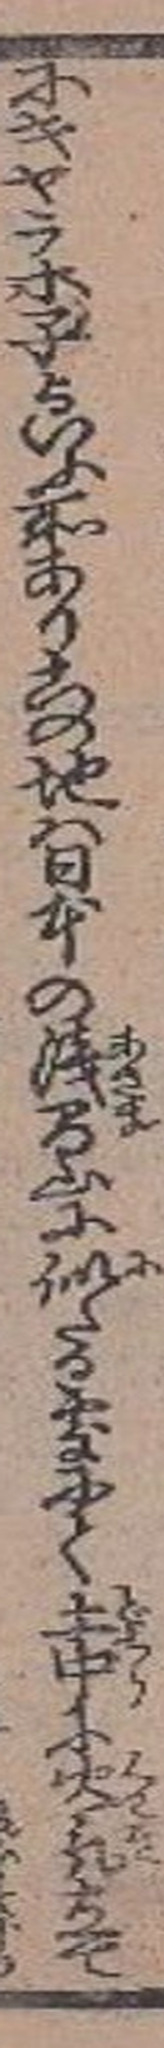にキヤラホネといふ所ありこの地は日本の浅間山に似たる処にて土中に火気立て
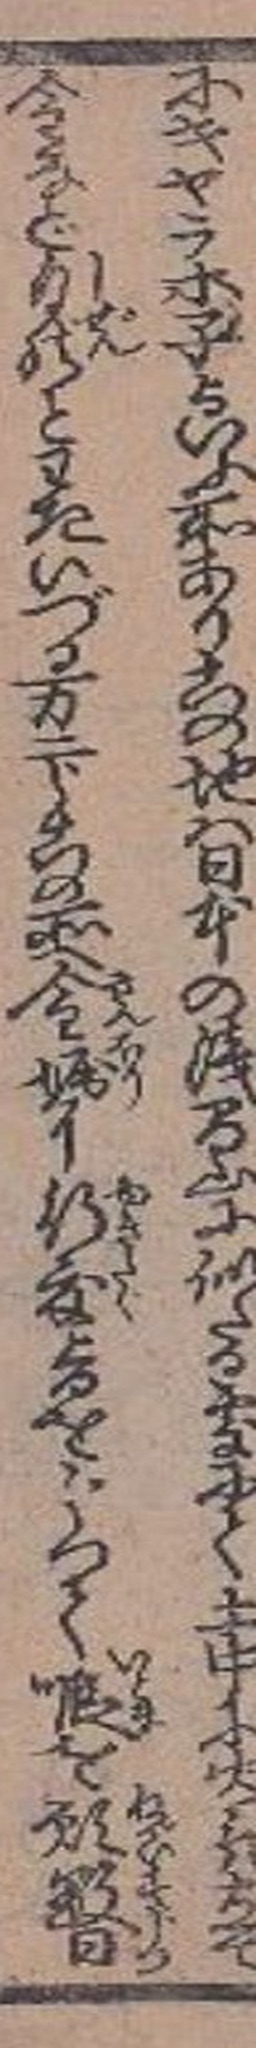金など自然とわきいづる万二郎この所へ金掘に行度旨をじ？つて暇を願数日
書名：満次郎漂流記
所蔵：University of the Ryukyus Library
